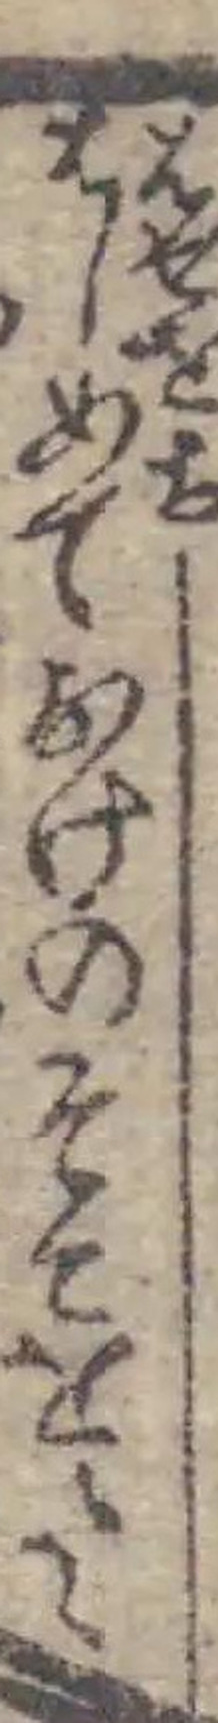はしめておけのそこをたゝ
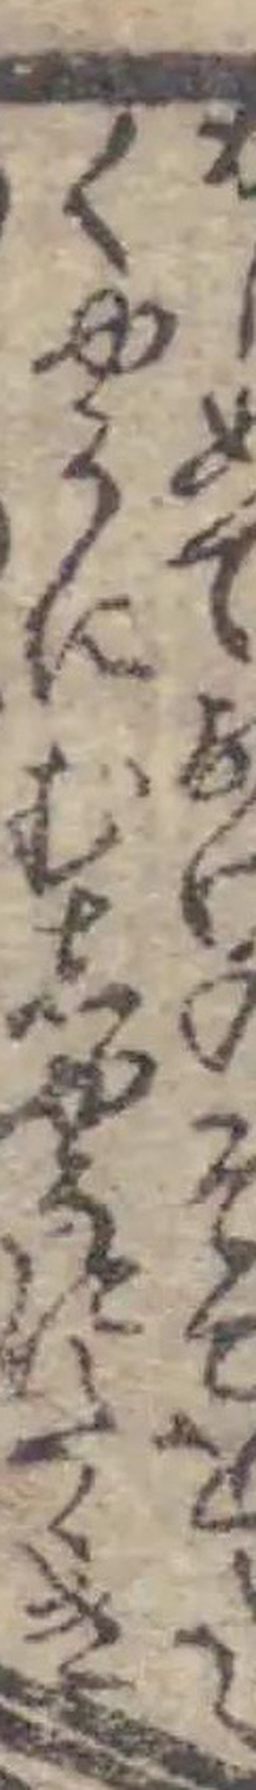くやうにみしやうにたゝき
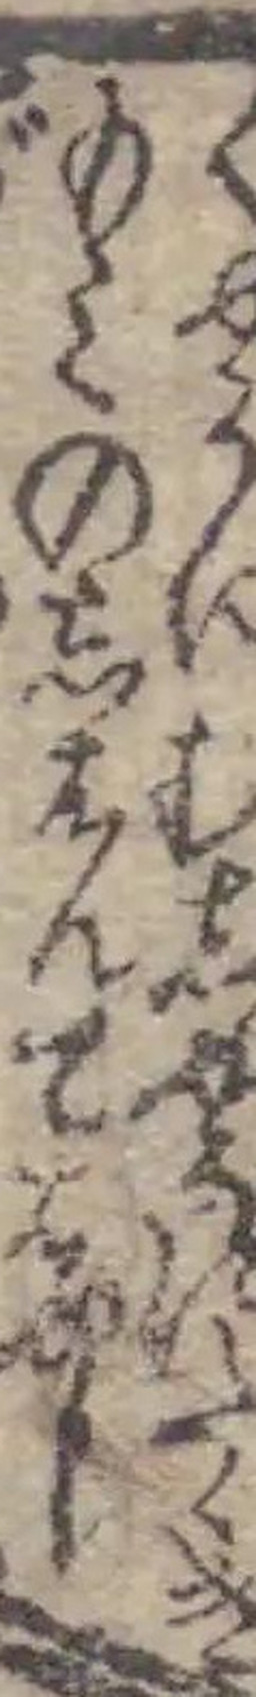もみのしはんてやはし
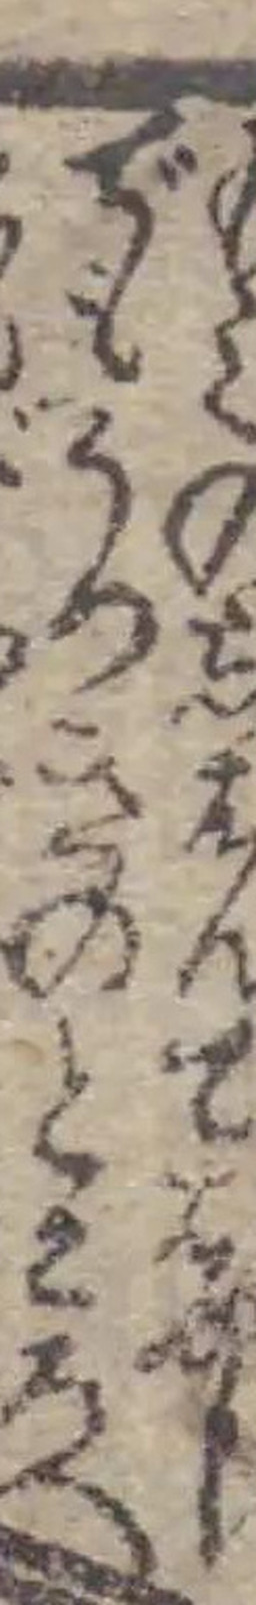でもうつきのところへ
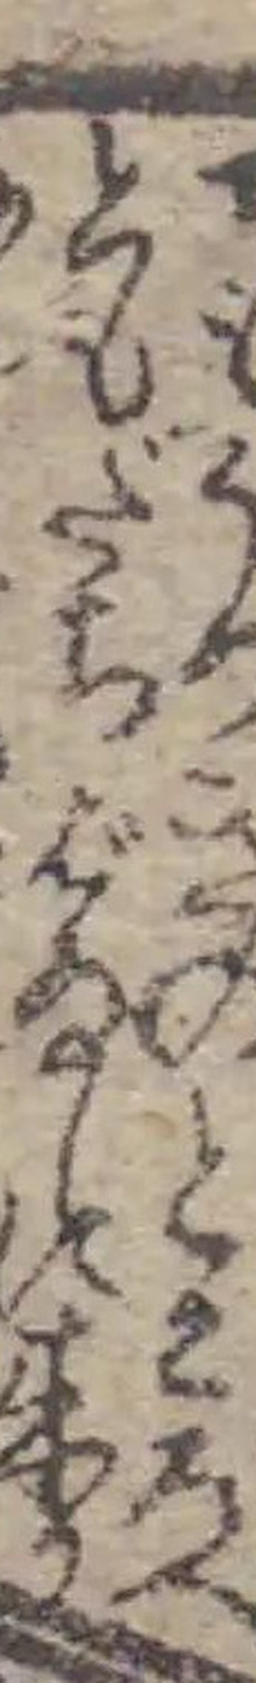ともだちばなしに来り
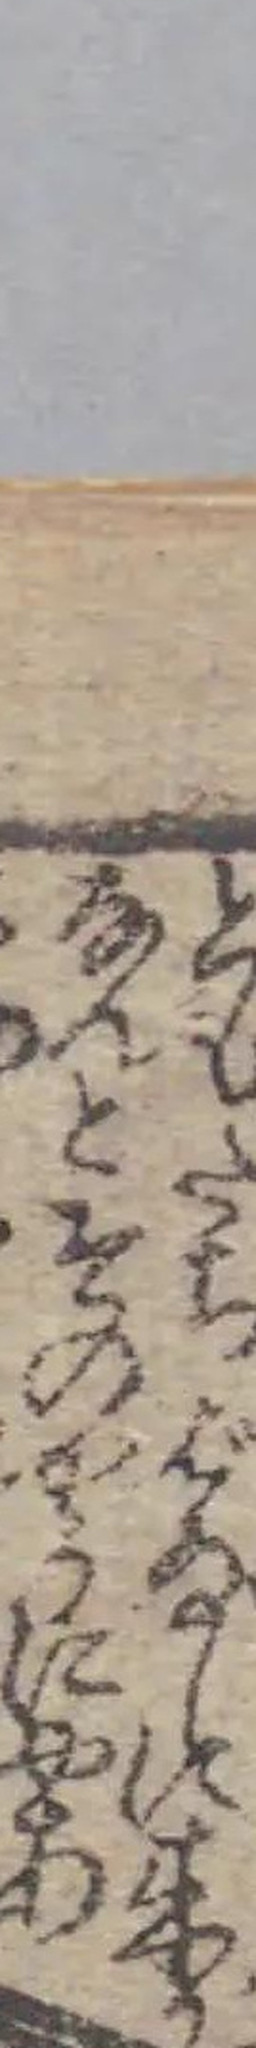なんとそのやうにやあ
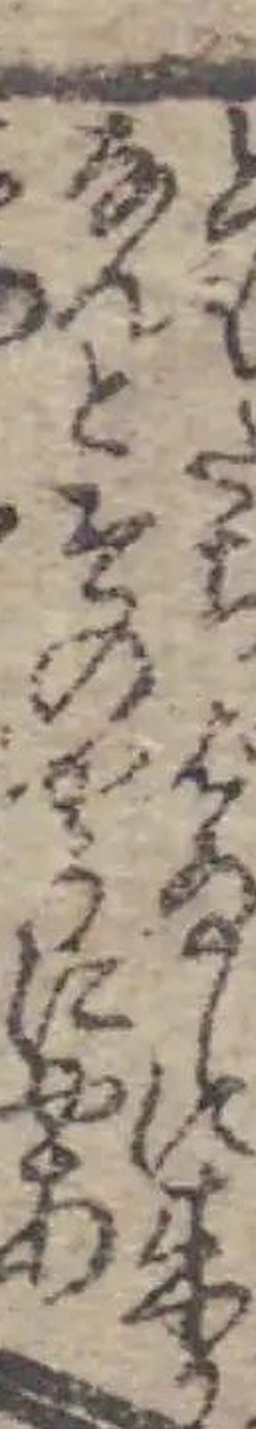なんとそのやうにやあ
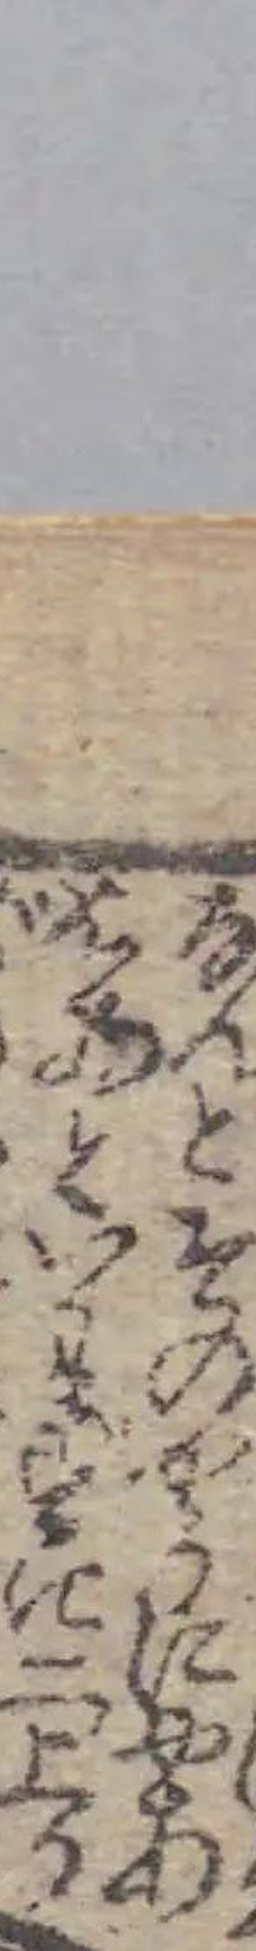はあといわすに二上り
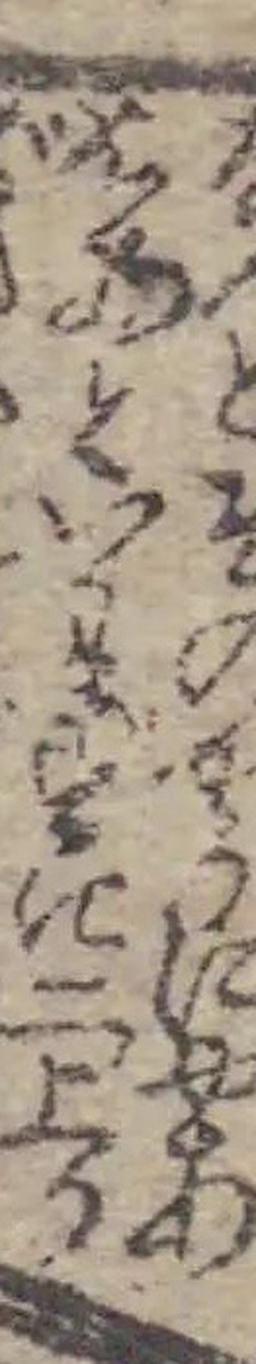はあといわすに二上り
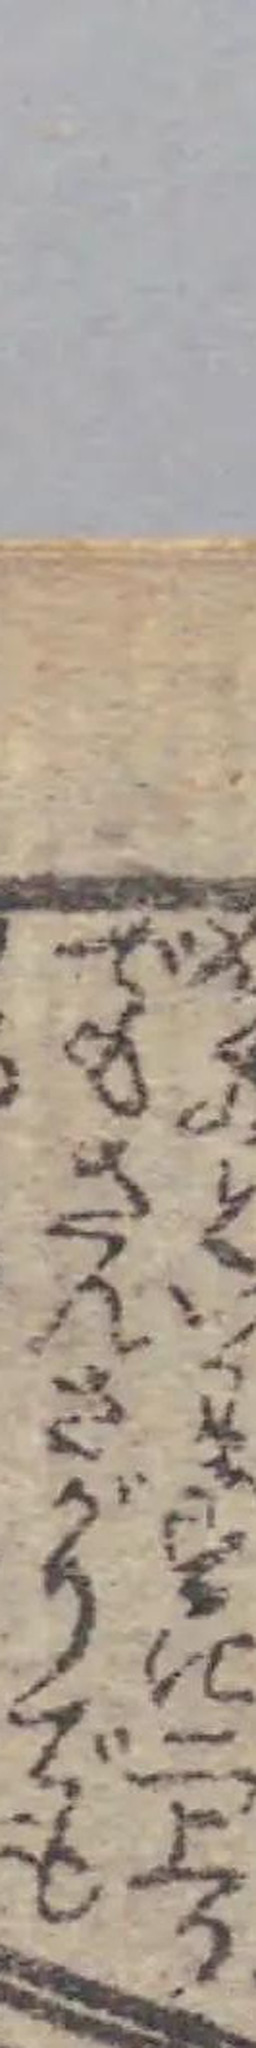でもさんさがりでも
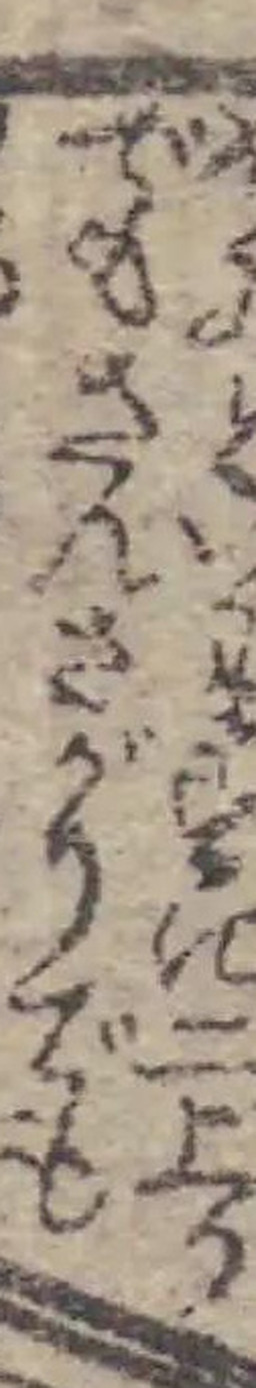でもさんさがりでも
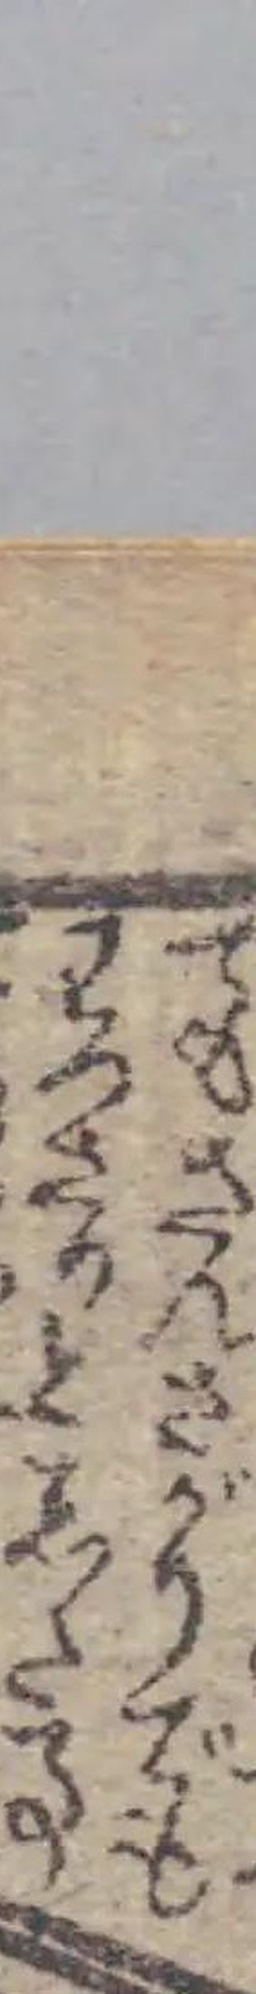わつさりとした事
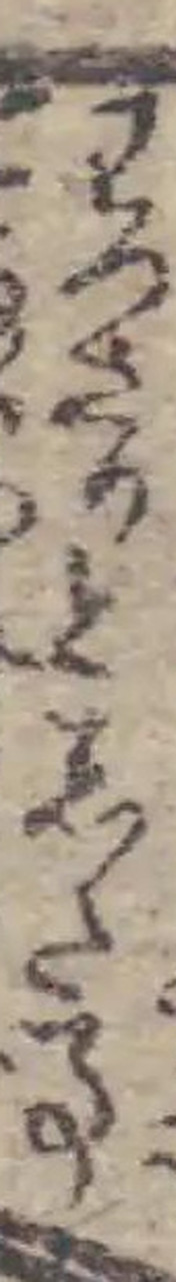わつさりとした事
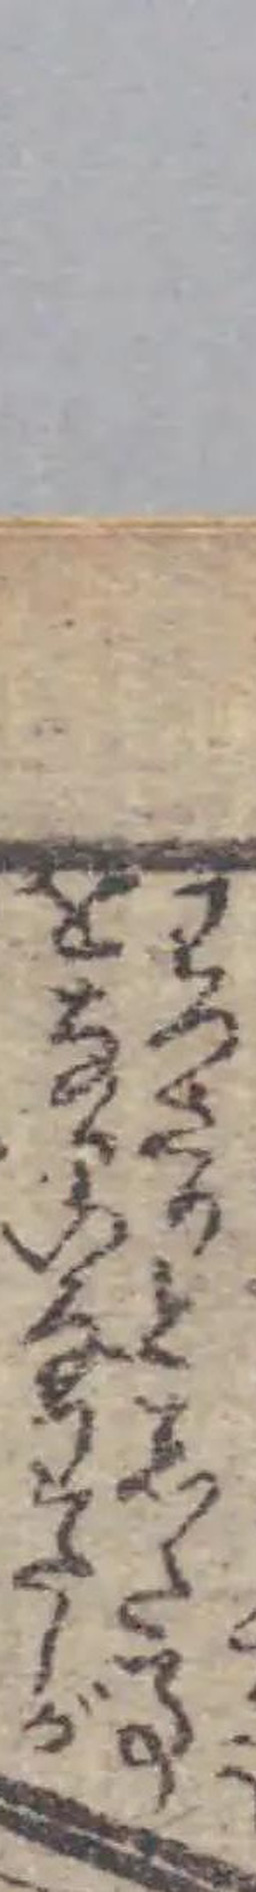をないなわとしが
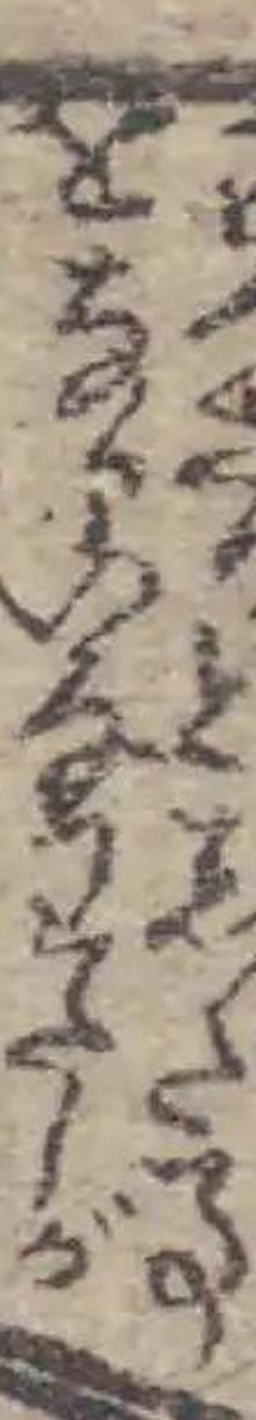をないなわとしが
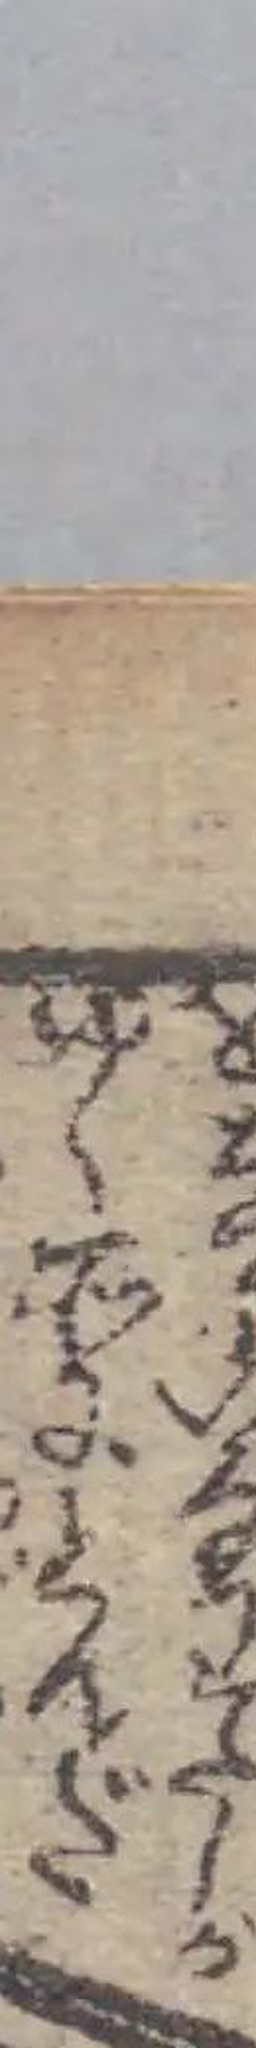ゆく所にとんだ
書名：津以曽無弟の甚六 3巻
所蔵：国立国会図書館 National Diet Library, JAPAN
